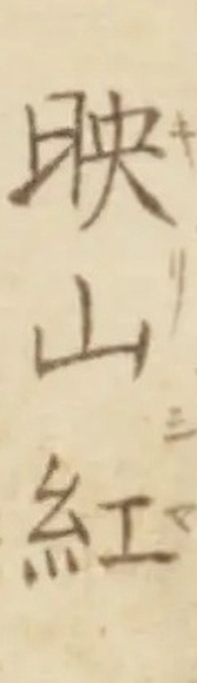映山紅
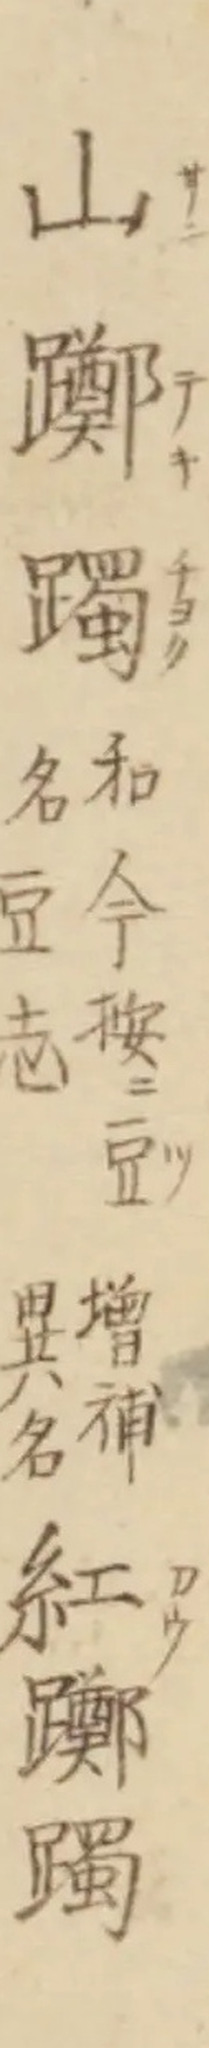紅躑躅
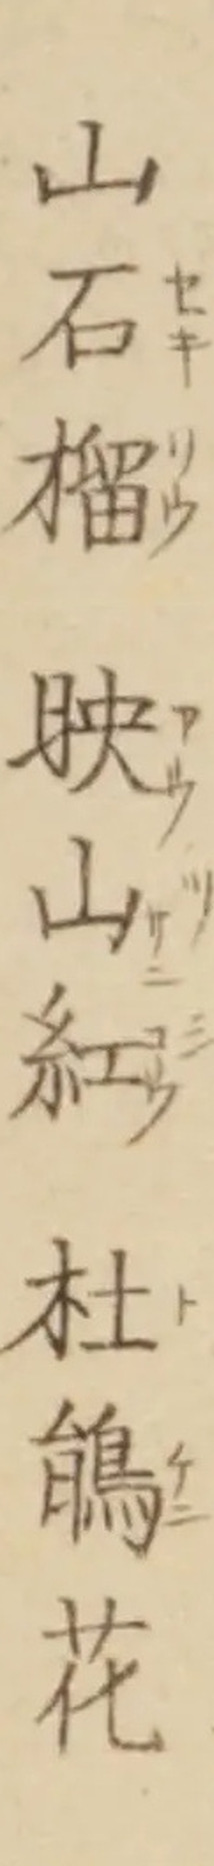山石榴映山紅杜鵑花

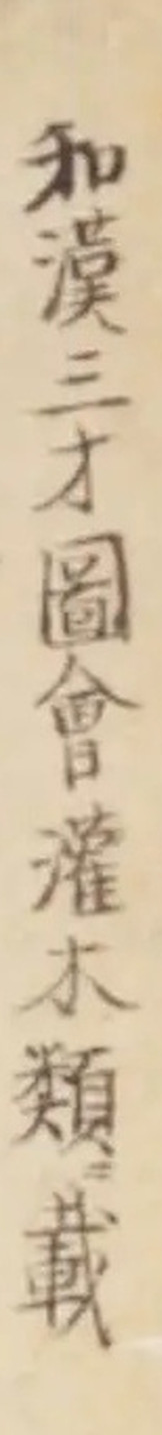和漢三才図会灌木類載
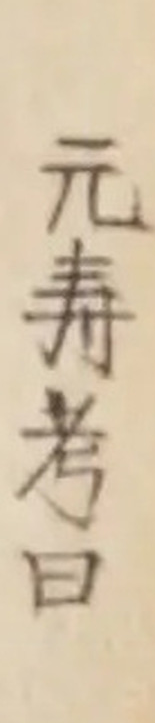元寿考曰
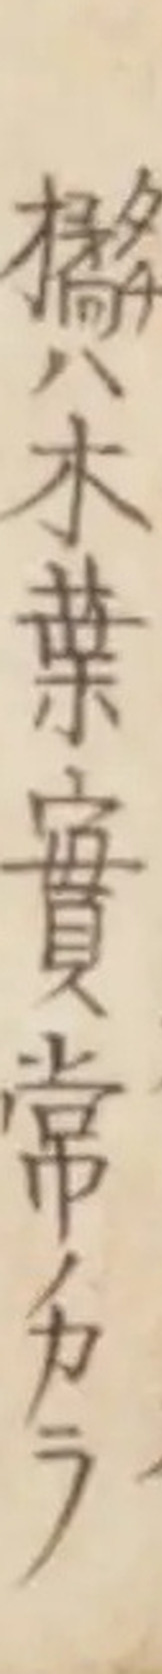橘ハ木葉実常ノカラ
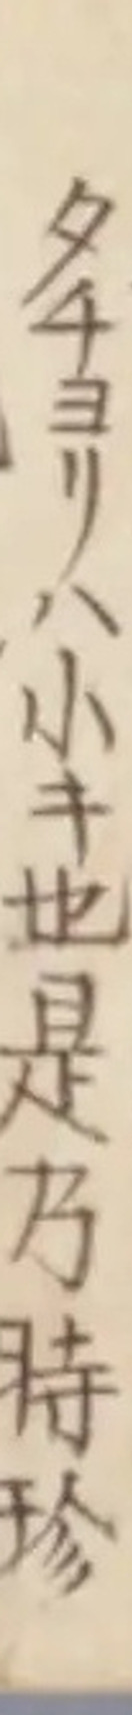タチヨリハ小キ也是乃時珍
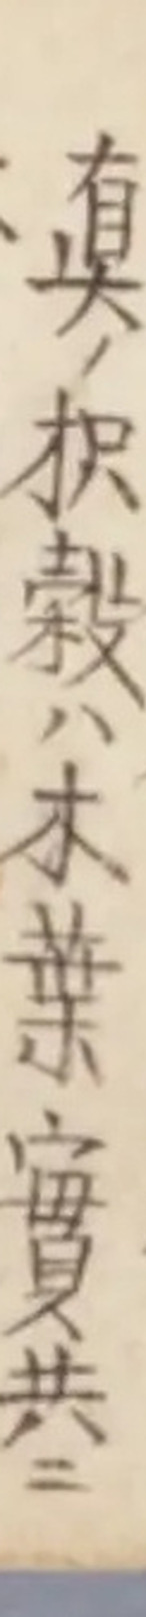真ノ枳殻ハ木葉実共ニ
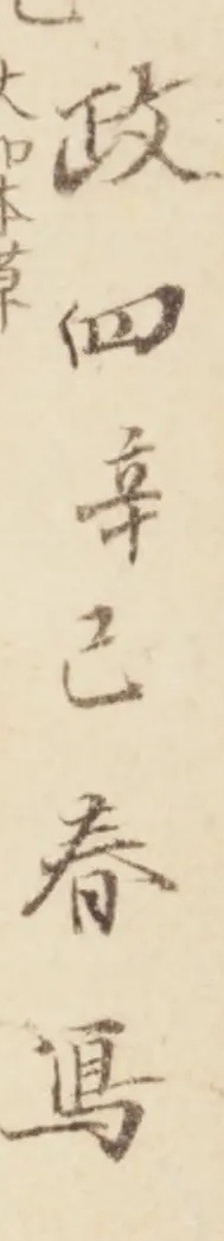政四辛巳春写
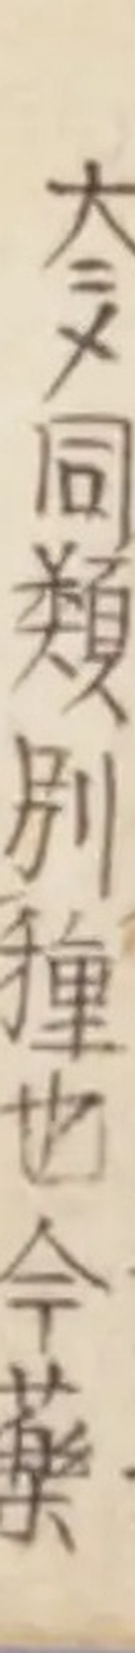大ニシテ同類別種也今薬
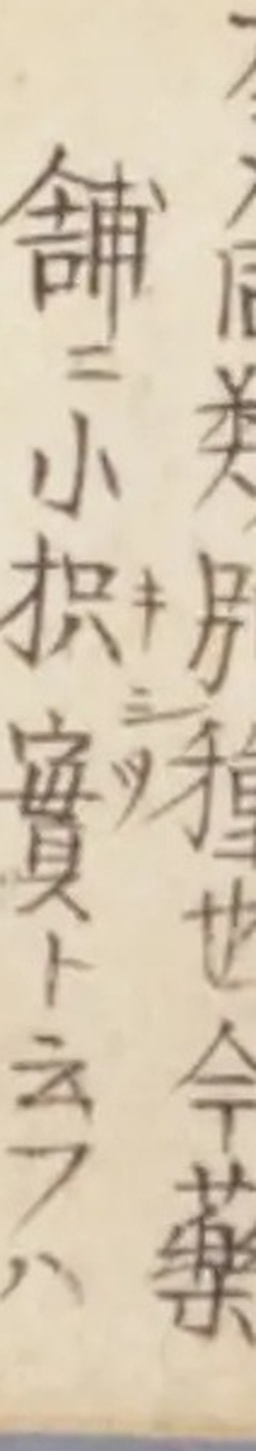舗ニ小枳実ト云フハ
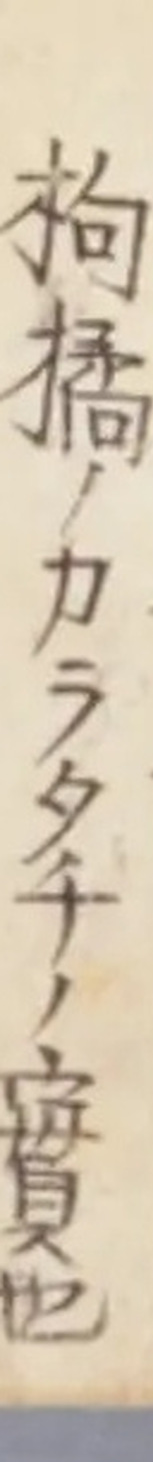狗橘ノカラタチノ実也
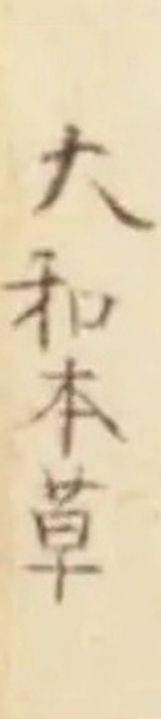大和本草
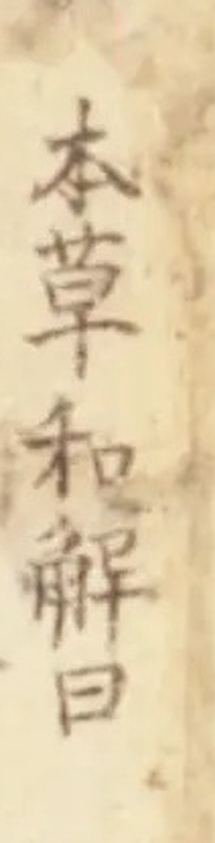本草和解曰
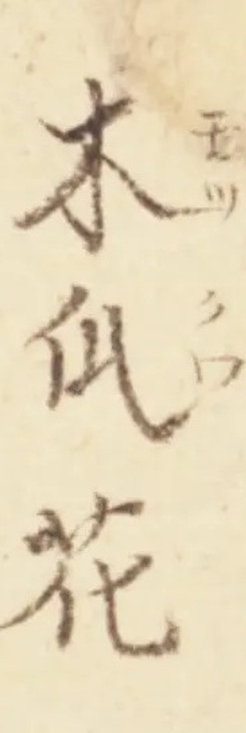木瓜花
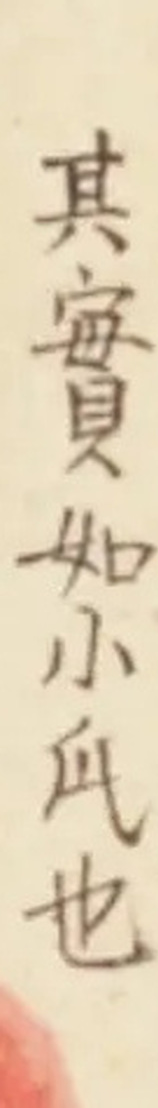其実如小瓜也
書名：梅園草木花譜春之部. 1
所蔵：国立国会図書館 National Diet Library, JAPAN
